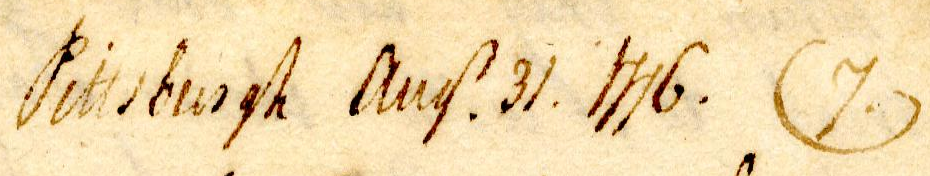Pittsburgh Aug. 31. 1776. 7.
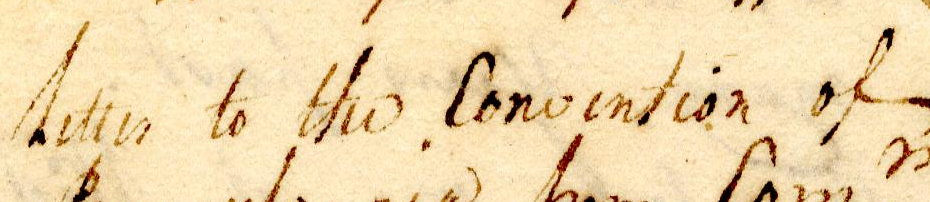Letter to the Convention of
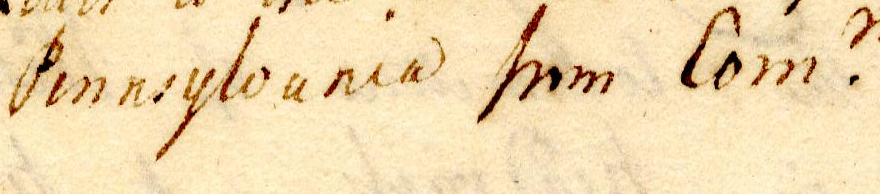Pennsylvania from Com^r.
